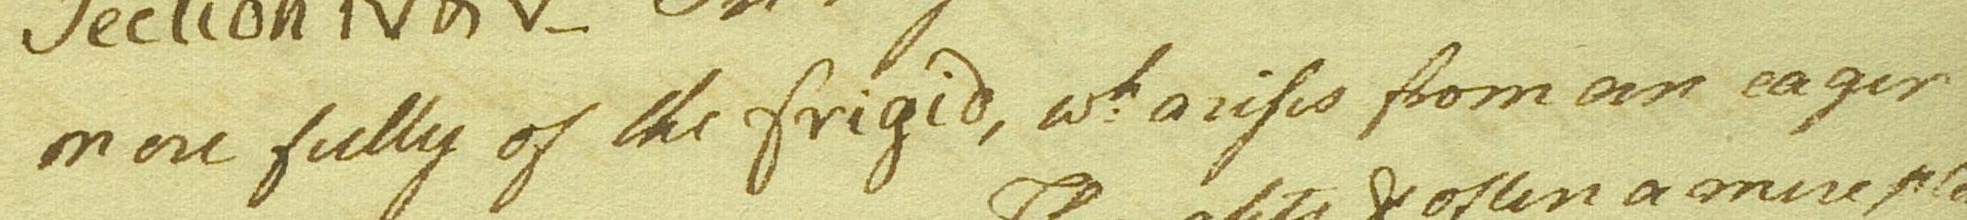more fully of the frigid, w^h: arises from an eager
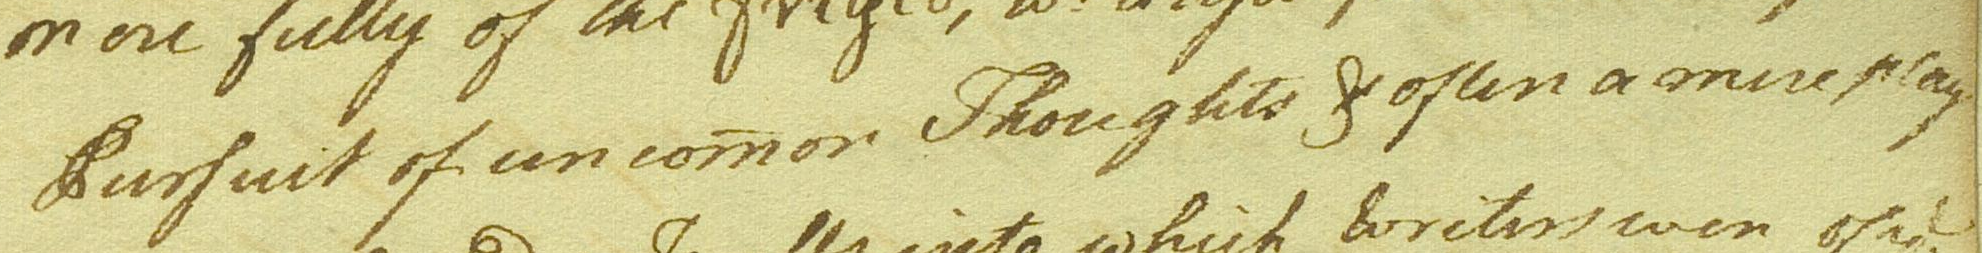Pursuit of uncom̄on Thoughts & often a mere play
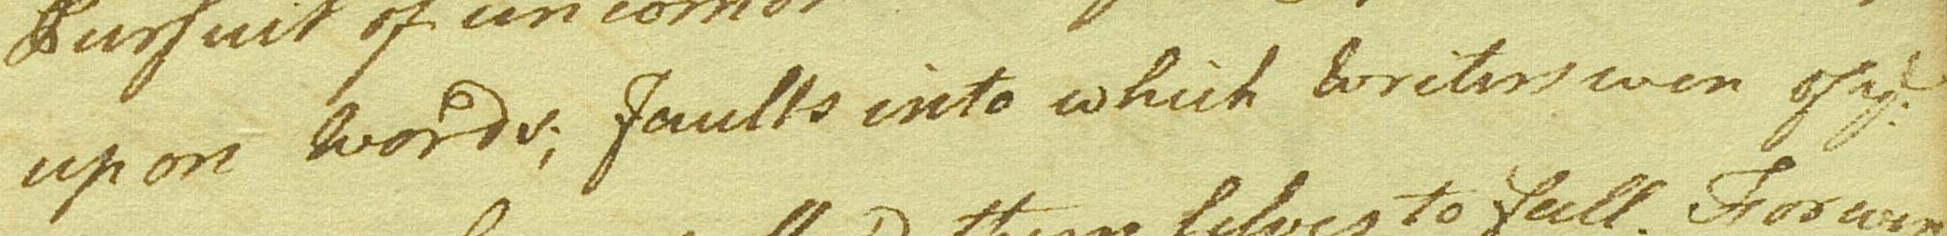upon words; faults into which writers even of y^e:
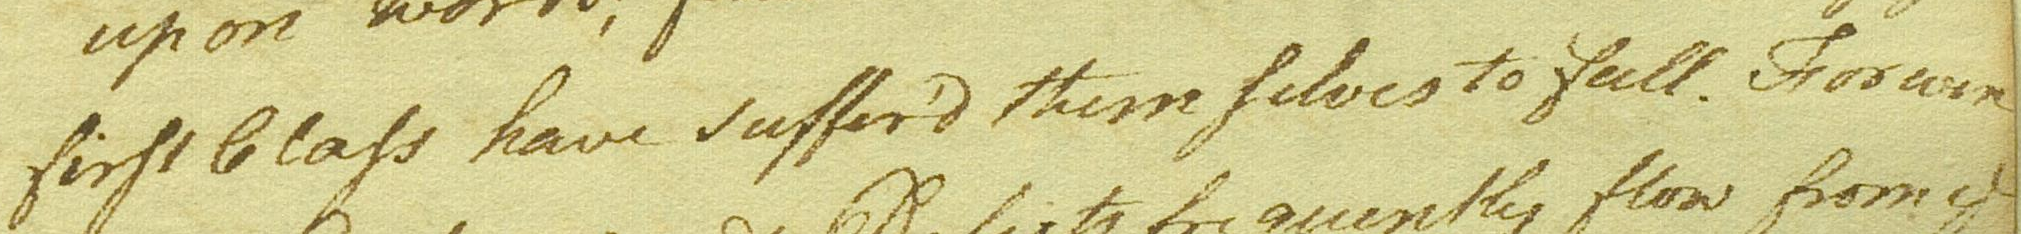first Class have suffer'd themselves to fall. For even
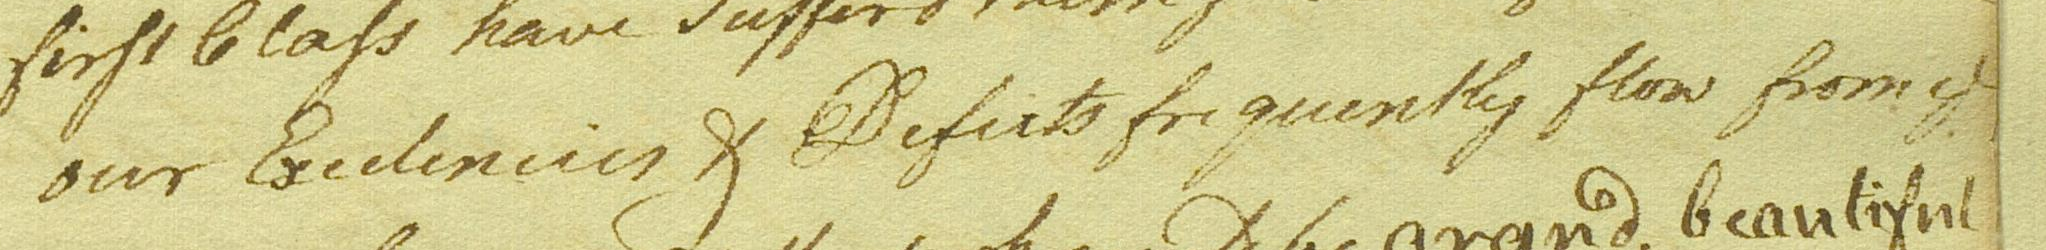our Excelencies & Defecits frequently flow from y^e
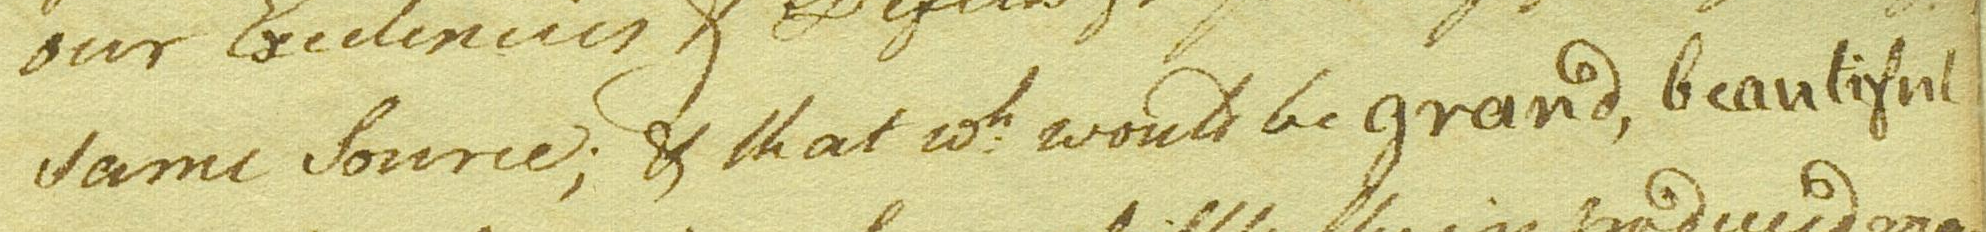same Source; & that w^h: would be grand, beautiful
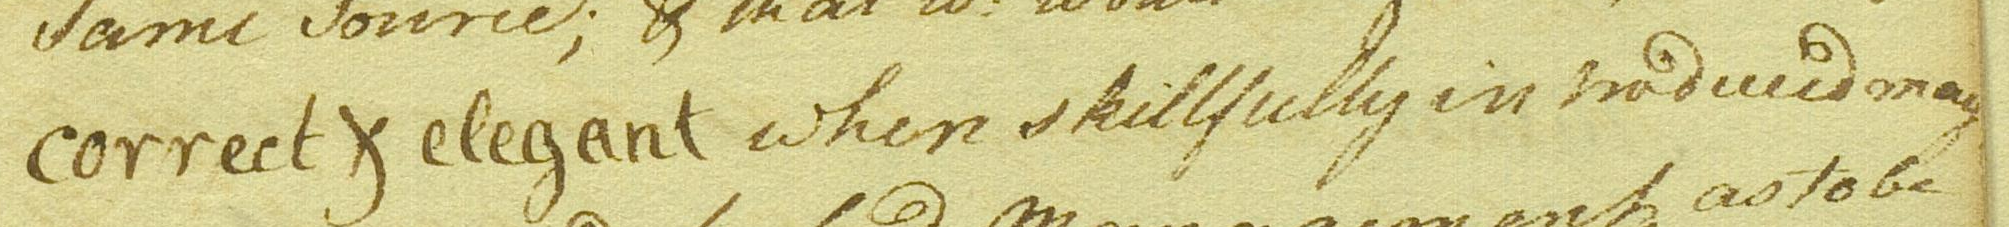correct & elegant when skillfully introduced may
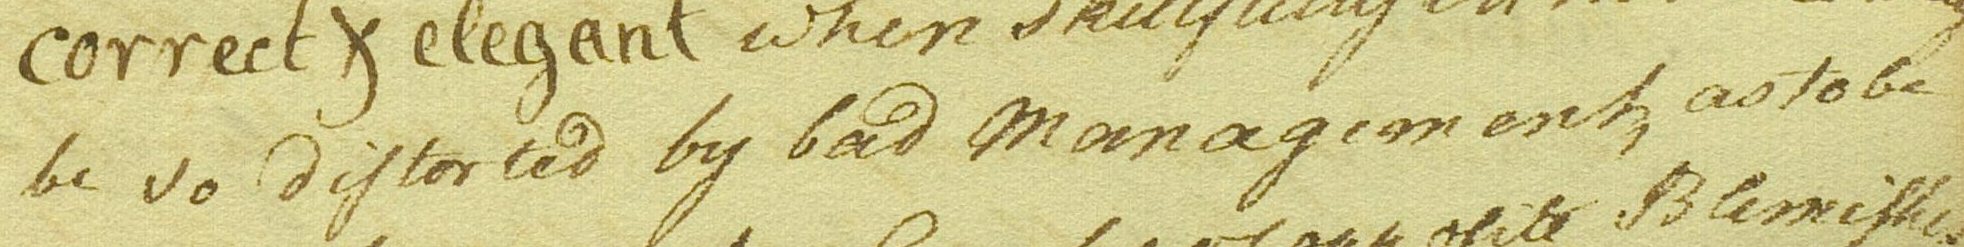be so distorted by bad management, as to be
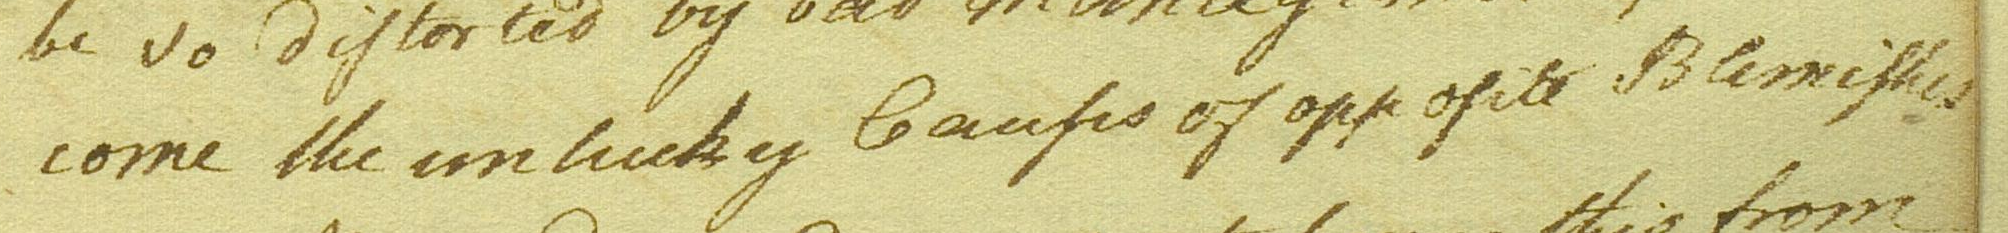come the unlucky Causes of opposite Blemishes.
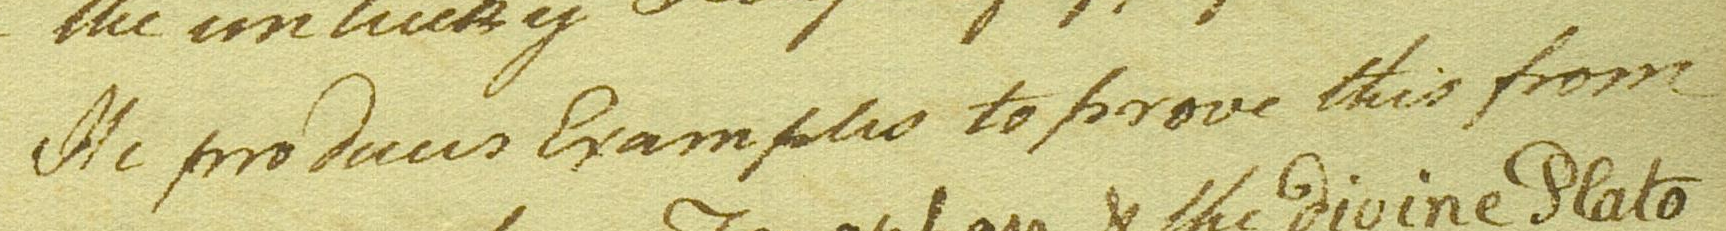He produces Examples to prove this from
